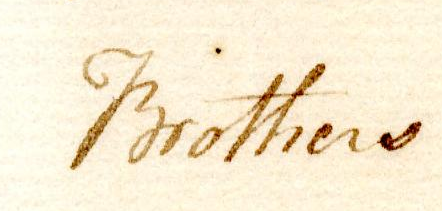Brothers
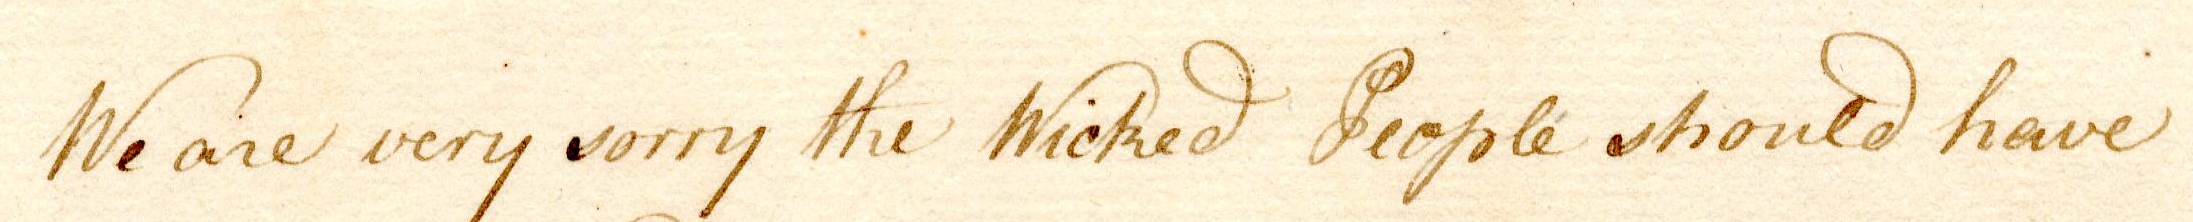We are very sorry the Wicked People should have
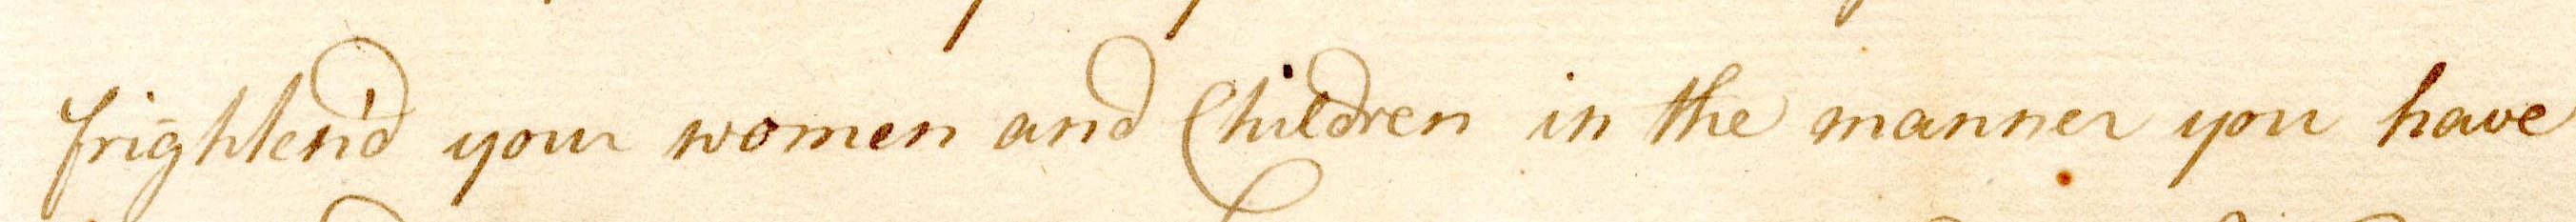frighten'd your women and Children in the manner you have
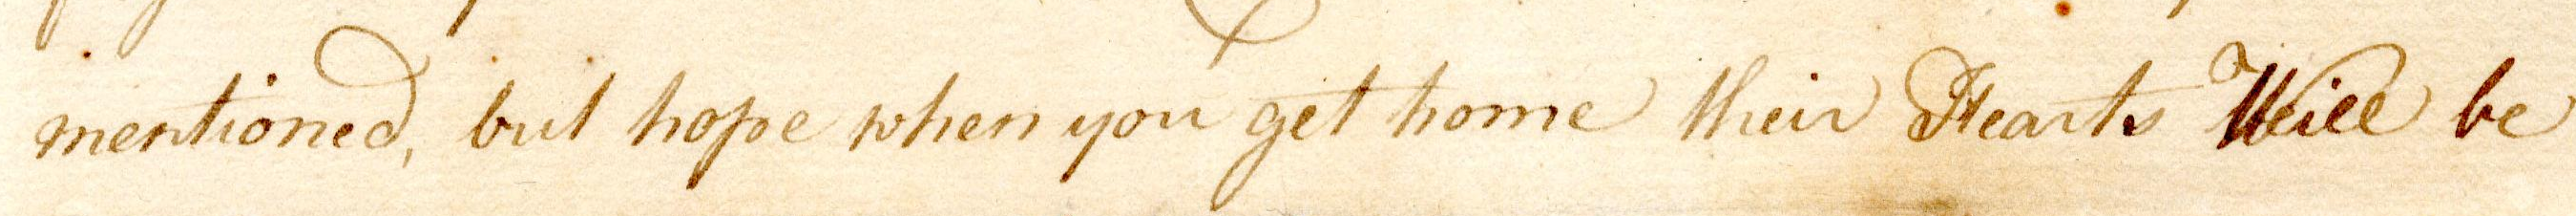mentioned, but hope when you get home their Hearts Will be
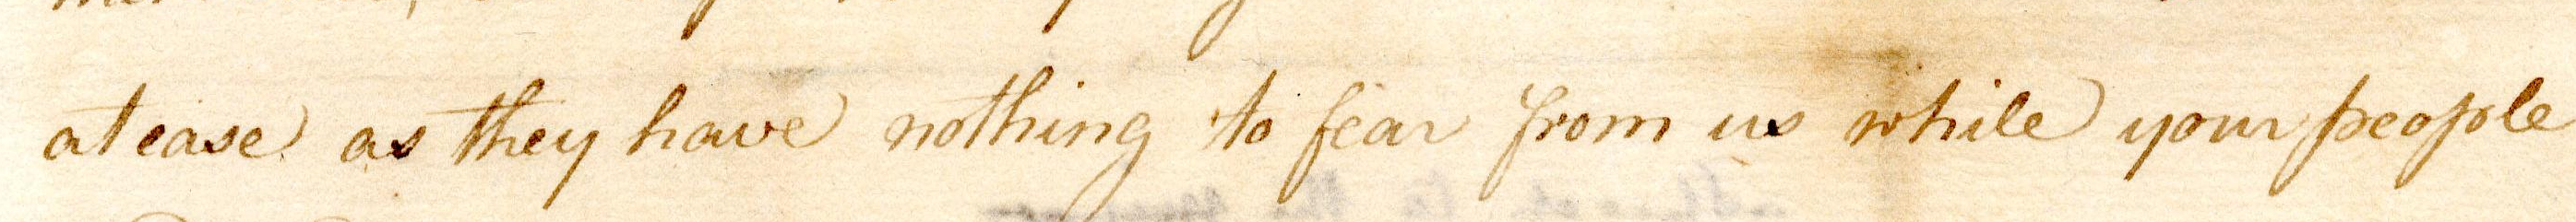at ease as they have nothing to fear from us while your people
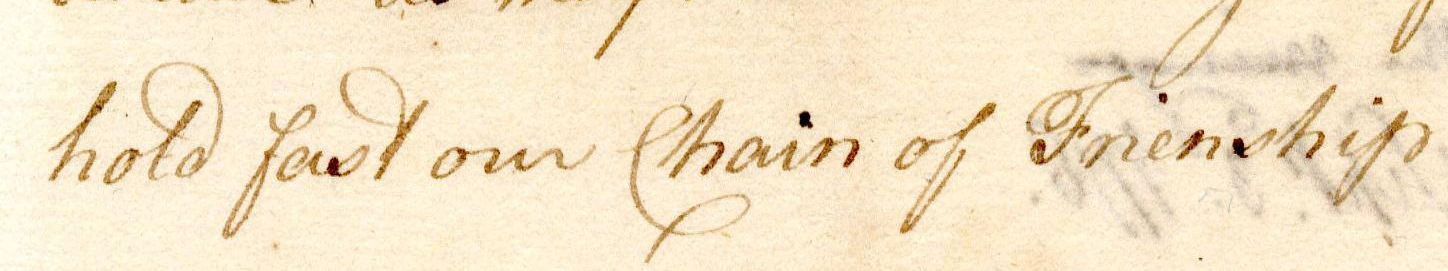hold fast our Chain of Friendship
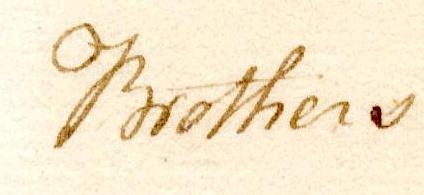Brothers
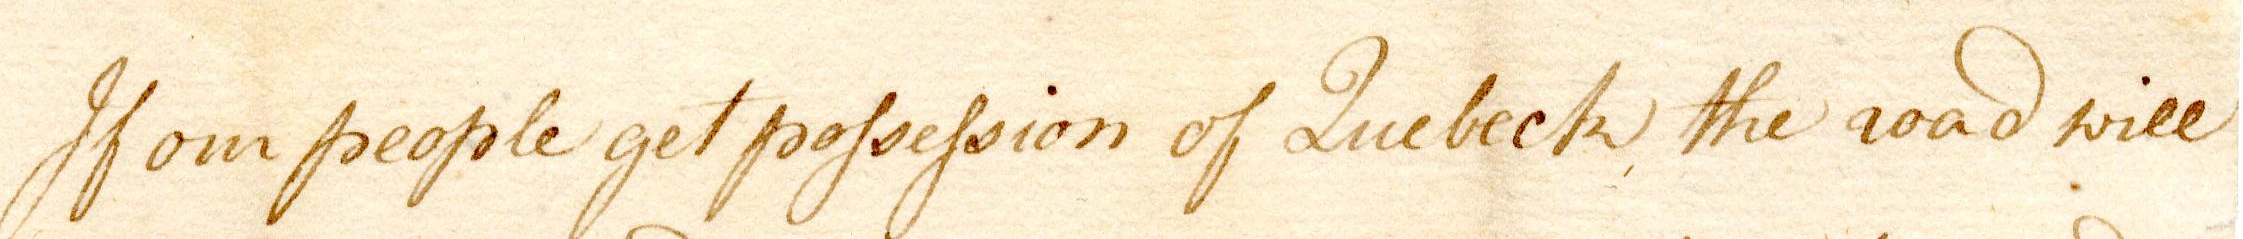If our people get possession of Quebeck the road will
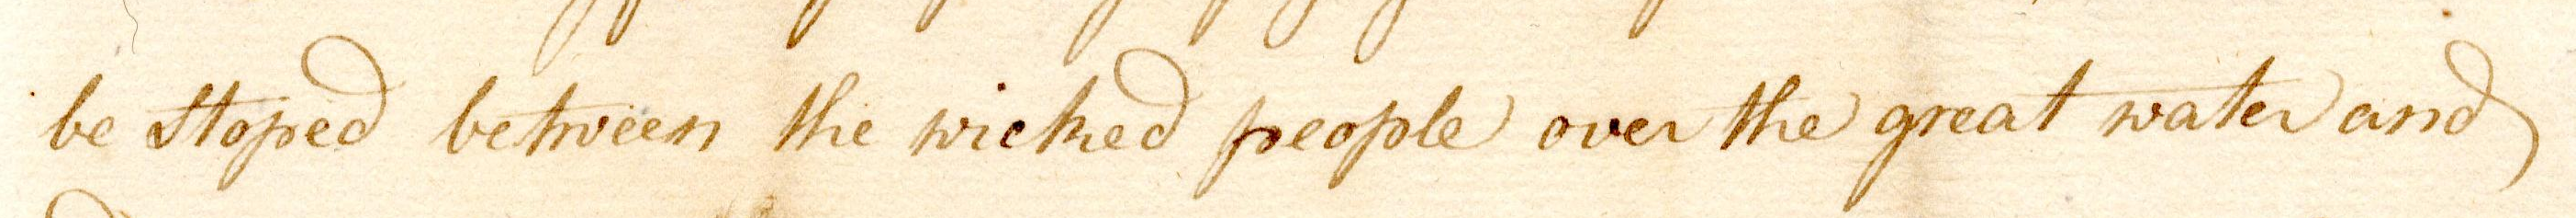be stoped between the wicked people over the great water and
